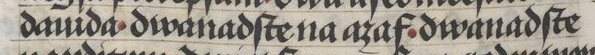davida.dwanadſte na azaf.dwanadſte
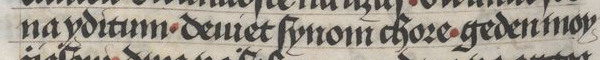na yditum.deviet ſynom choze.geden moy¬
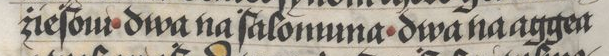żieẛow.dwa na ẛalomuna.dwa na aggea
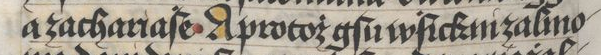a zachariaẛe.A protož gſu wẛickni zalmo¬
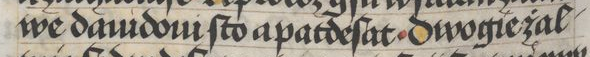we davidovi ſto a patdeſat.Dwogie żal¬
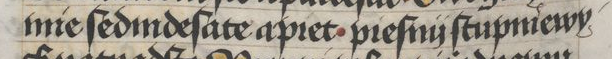mie ſedmdeſate a piet.píeſnij ſtupniewy¬
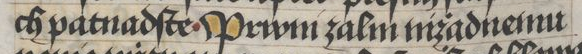ch patnadſte.Prwní zalm niżadnemu
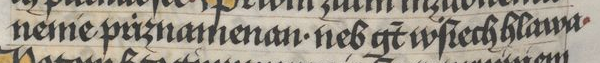nenie přiznamenan.neb ḡt wſiech hlawa.
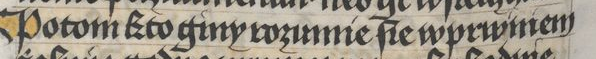Potom kto giny rozumie ſie wprwniem
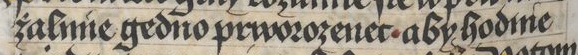žalmie gedno prworozenec.aby hodnie
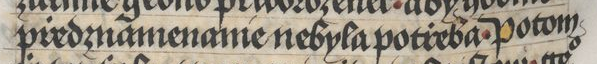předznamenanie nebyla potṙeba Potom
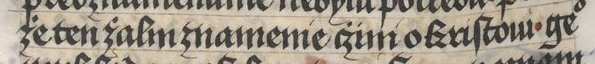že ten żalm znamenie cżiní o kriſtovi.geo
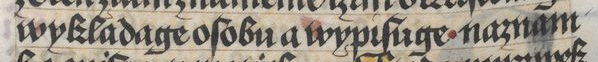wykladage oſobu a wypiſuge.naznam¬
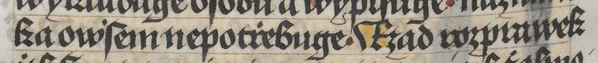ka owẛem nepotṙebuge.Ezad rozprawelz
